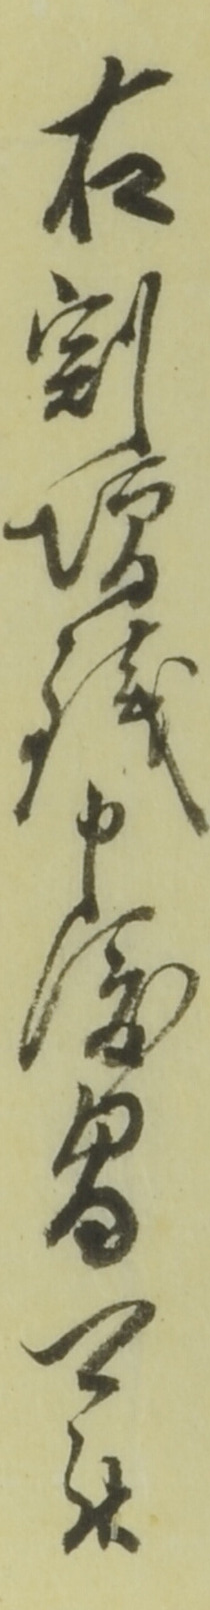右割増銭申渡候間可被

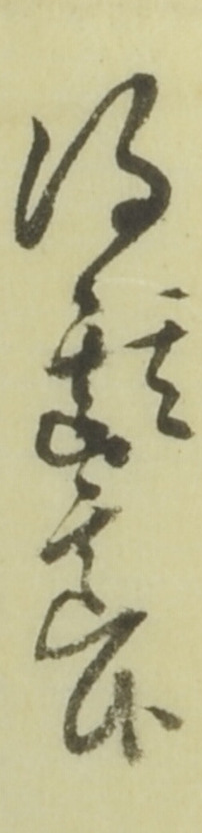得其意候
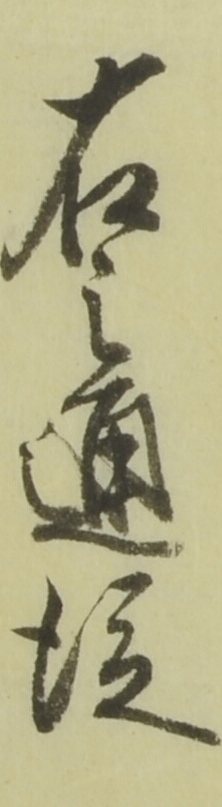右之通従
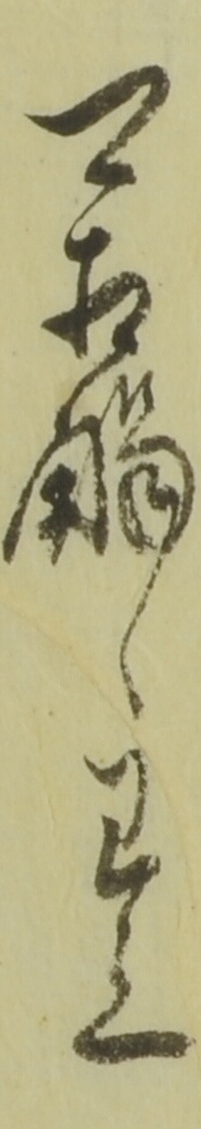可相触候已上
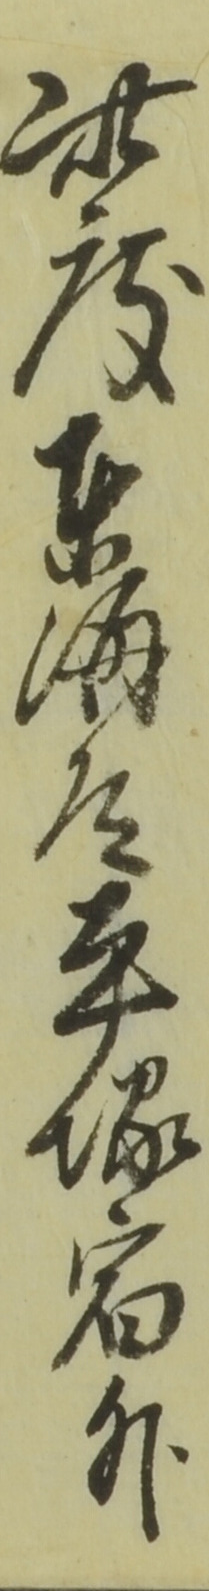此度東海道平塚宿外
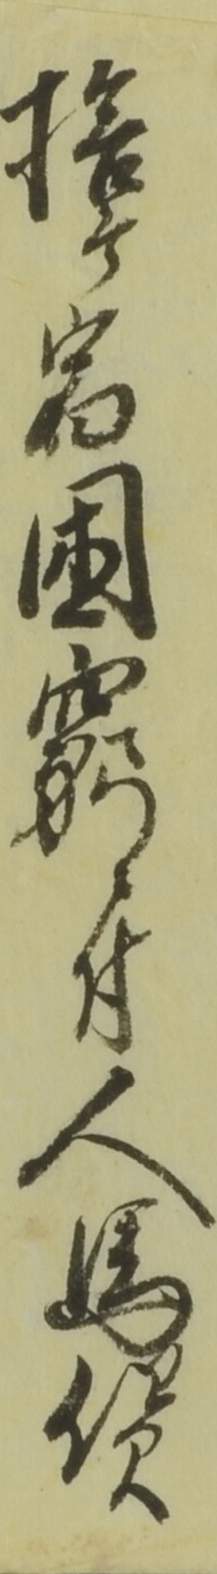拾ヶ宿困窮ニ付人馬賃
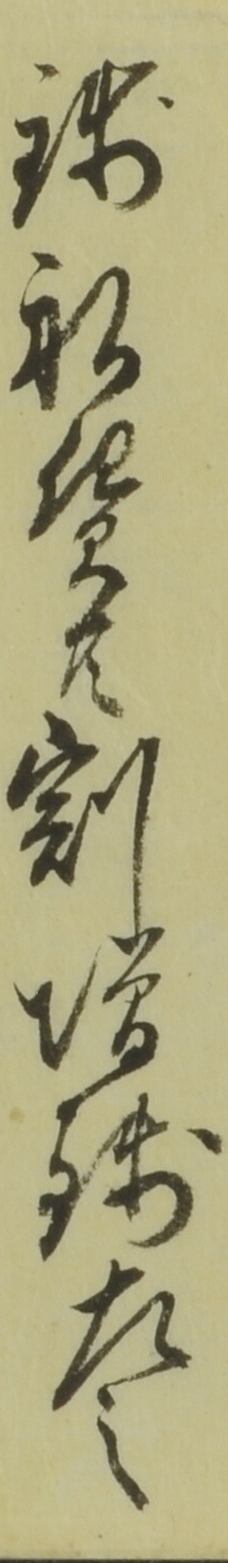銭船賃共割増銭左之
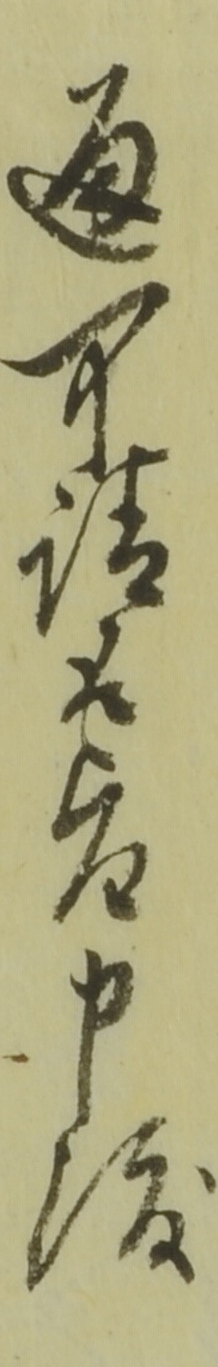通可請取旨申渡
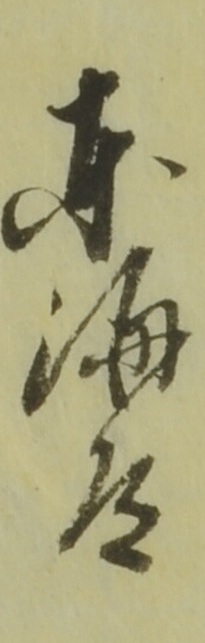東海道
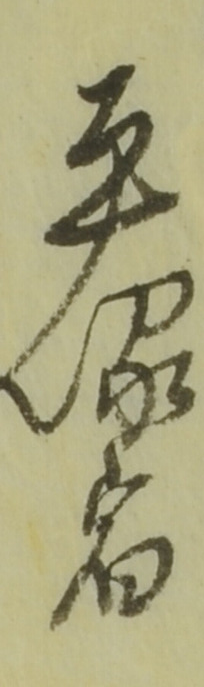平塚宿
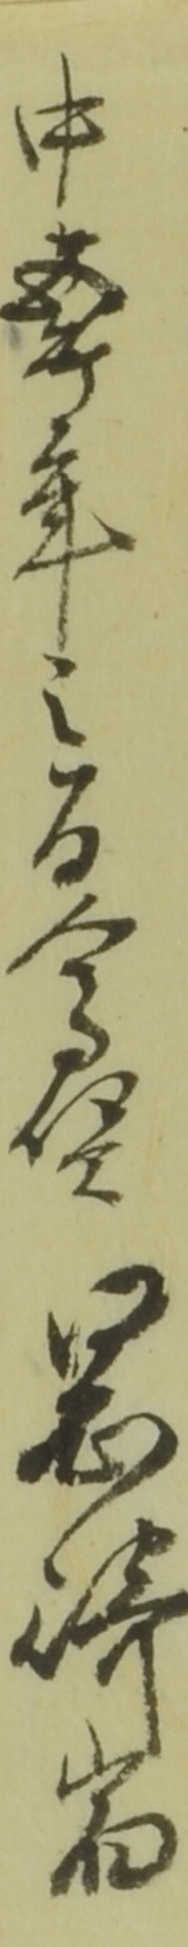中五ヶ年之間人馬賃岡崎宿
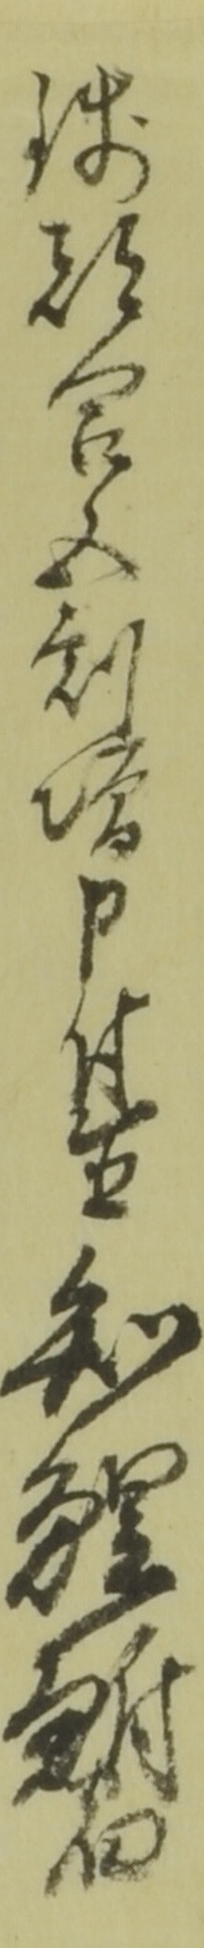銭都合五割増申付置池鯉鮒宿
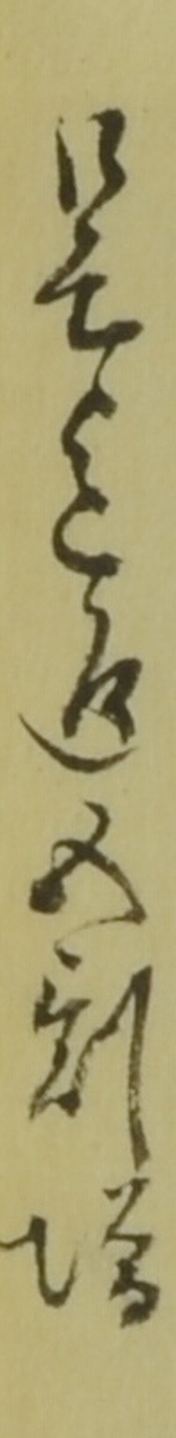是迄通五割増
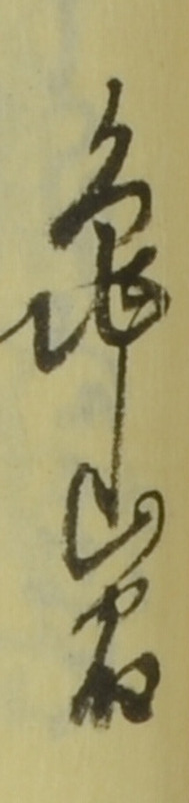亀山宿
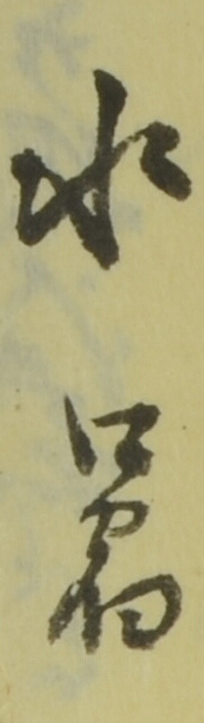水口宿

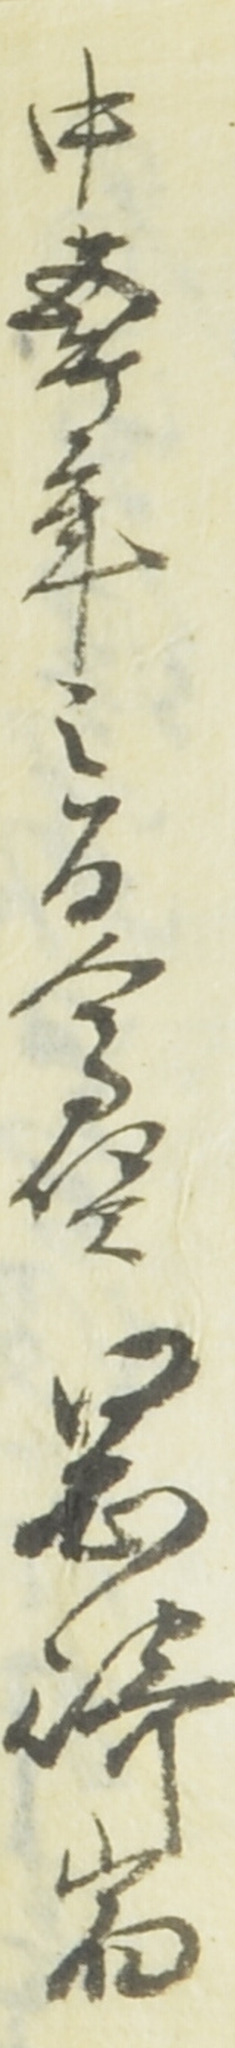中五ヶ年之間人馬賃岡崎宿
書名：御触書御書附控
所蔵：伊那市立高遠町図書館・合同会社AMANE
